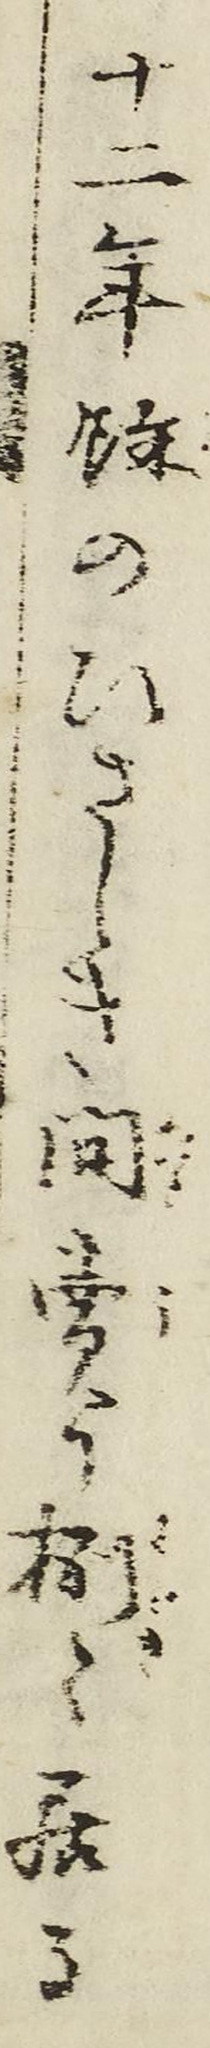十二年余のひさしき間売り捌て居る

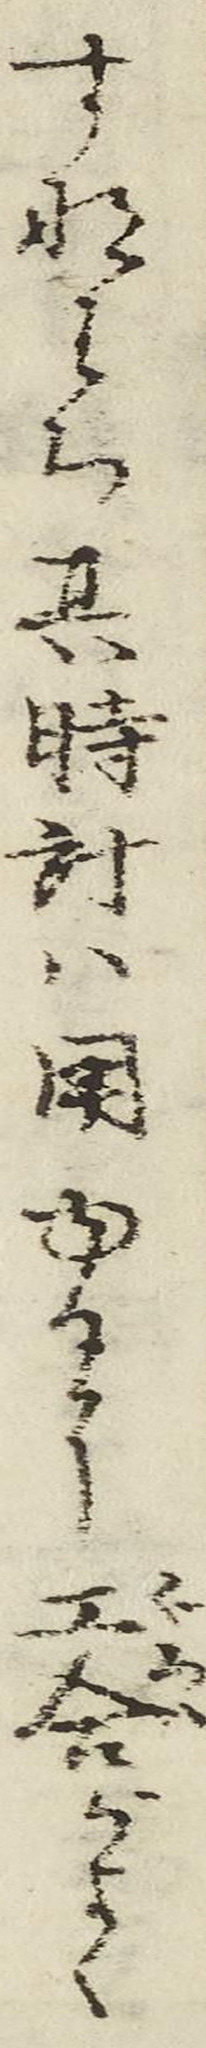すなはち其時計は用ゆるに工合がよく
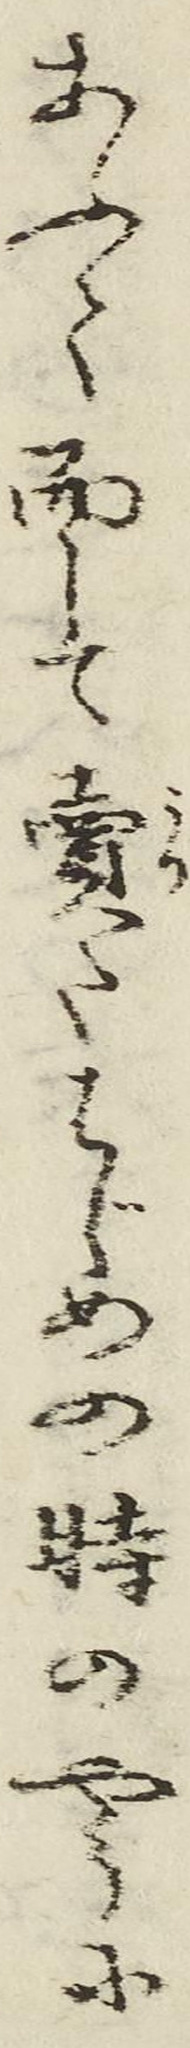あふて而して売たはじめの時のやうに
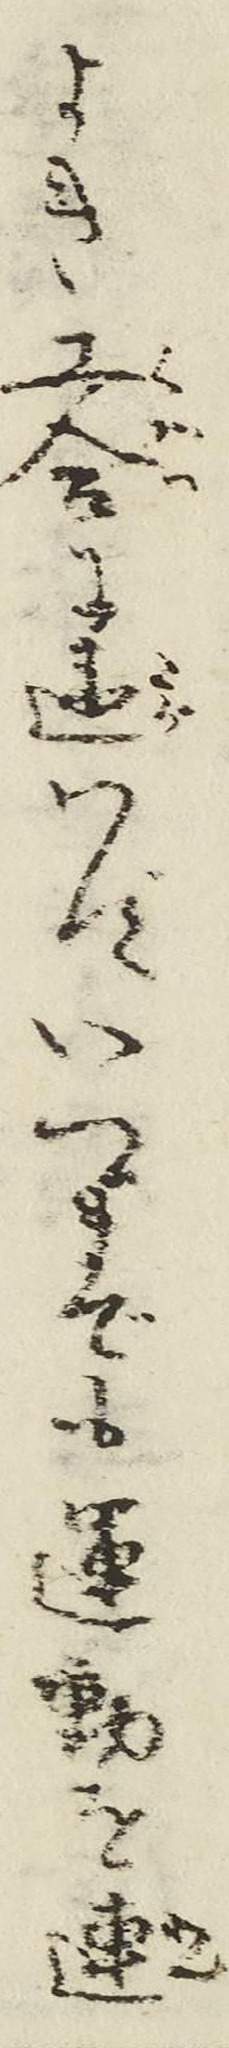よき工合に違はずいつまでも運動を連
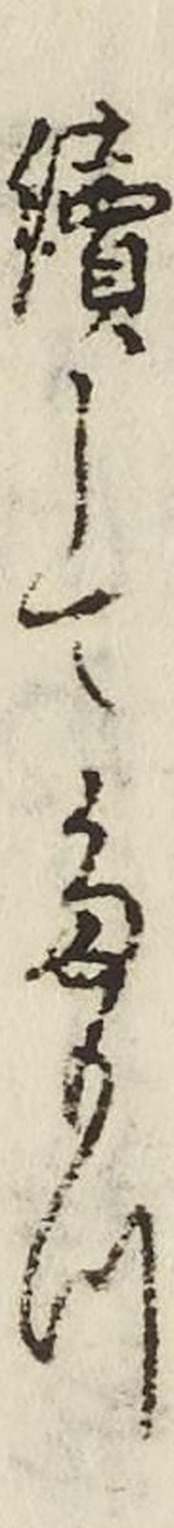続してたもつ
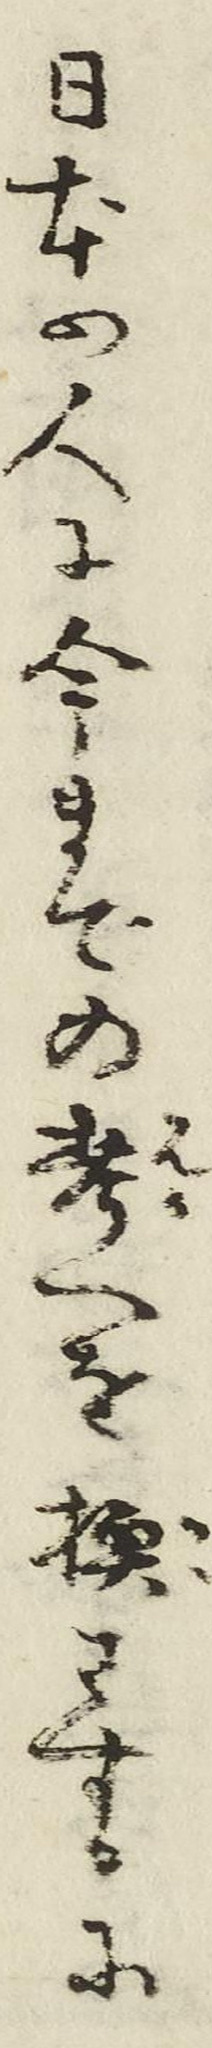日本の人に今までの考へを換さするに
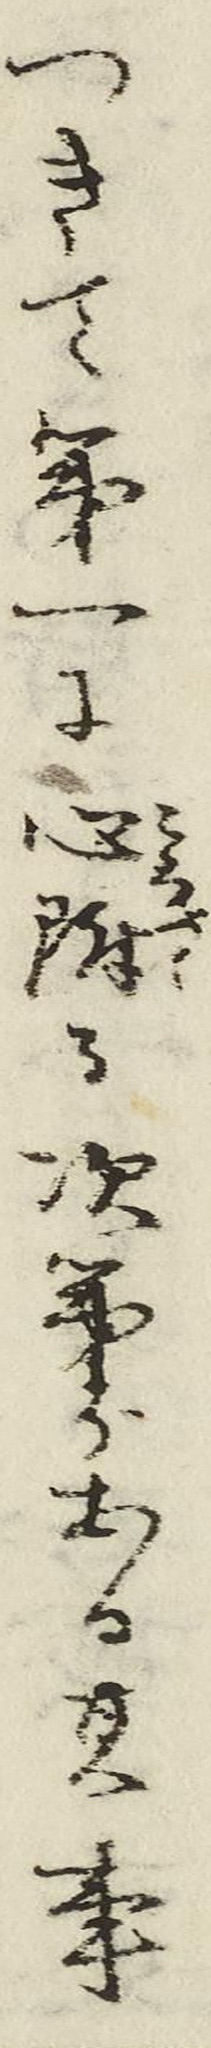つきて第一に心附る次第がある其事
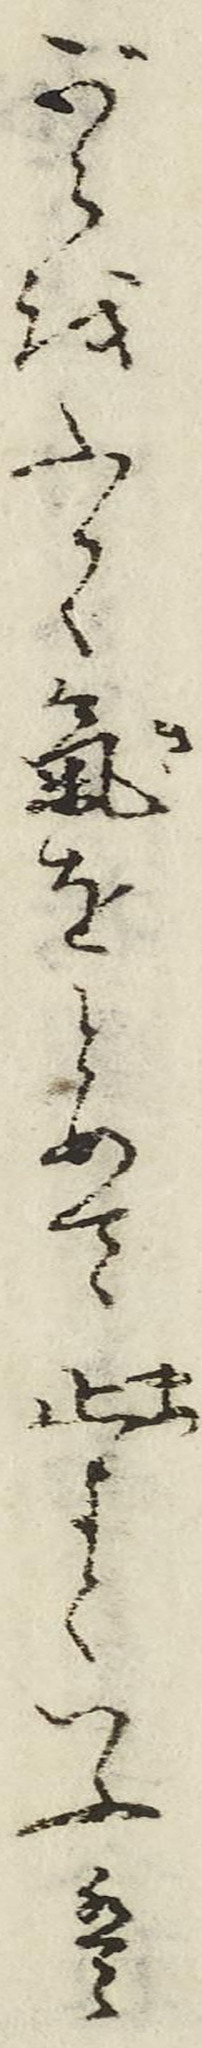がらをふかく気をとめて止よといふは
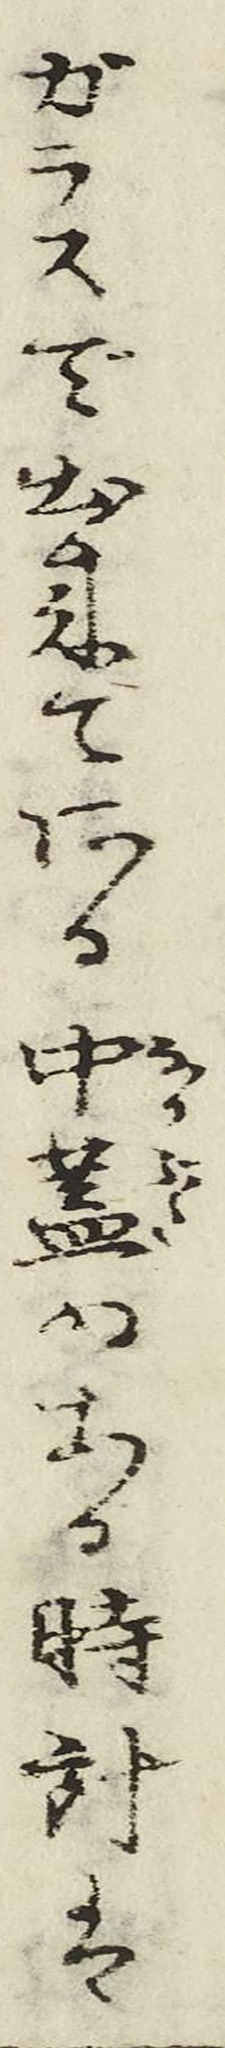ガラスで出来てある中蓋のある時計は
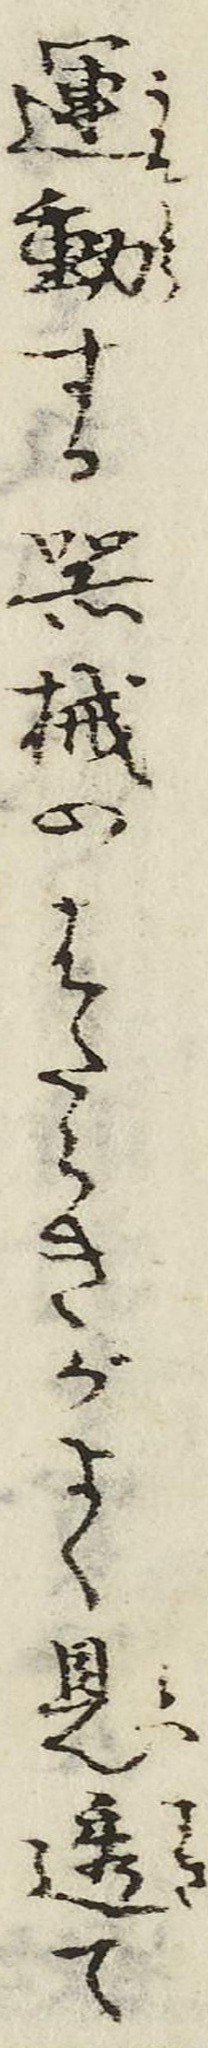運動する器械のはたらきがよく見透て
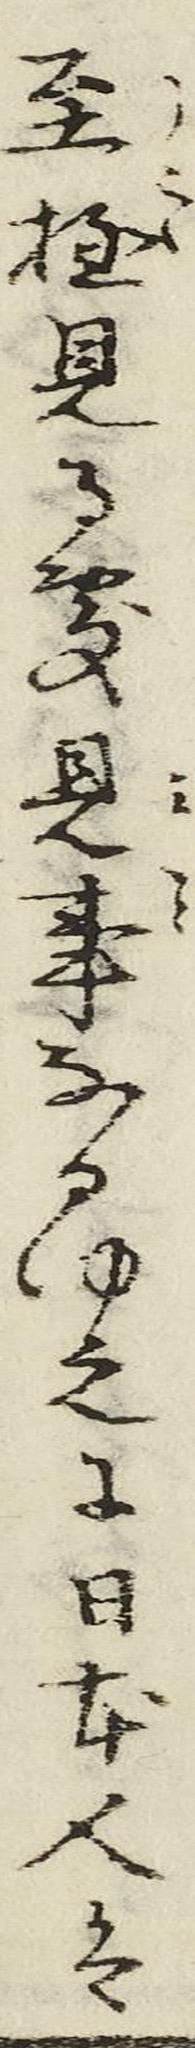至極見る処見事なるゆえに日本人は
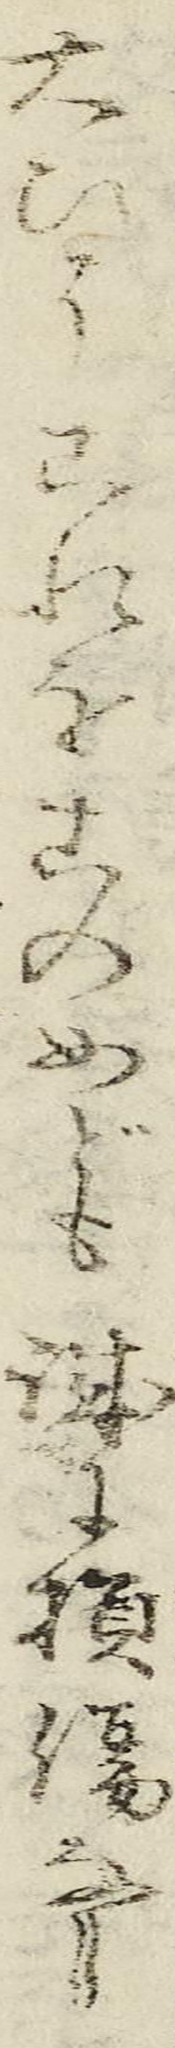大ひにこれをこのめども誠に損傷なし
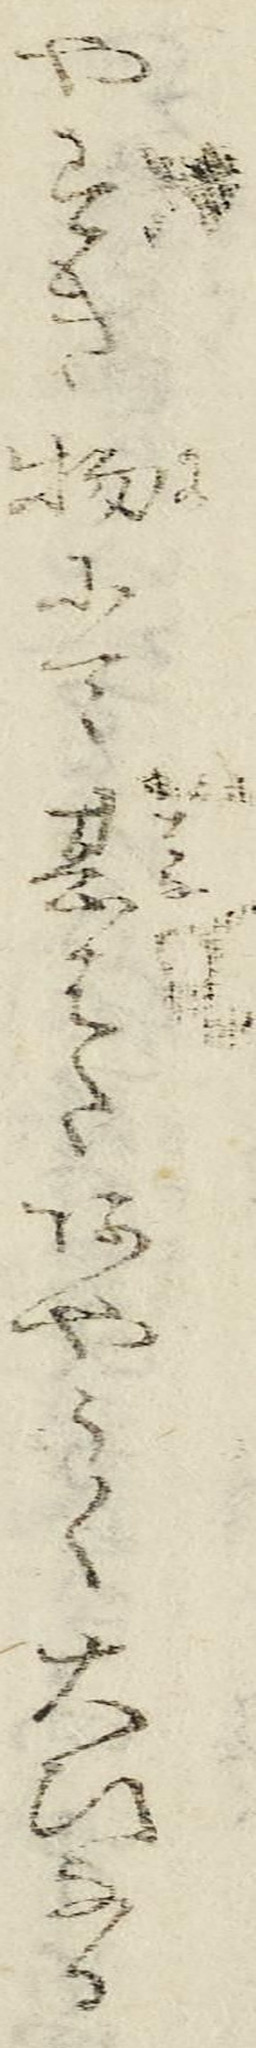やすき物にて甚はたあやうく大ひなる
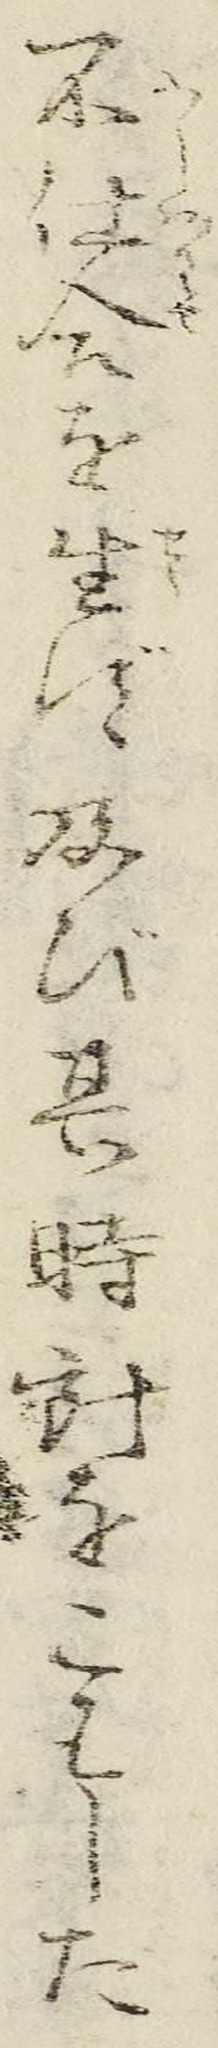不仕合を生ず及び其時計をこはした
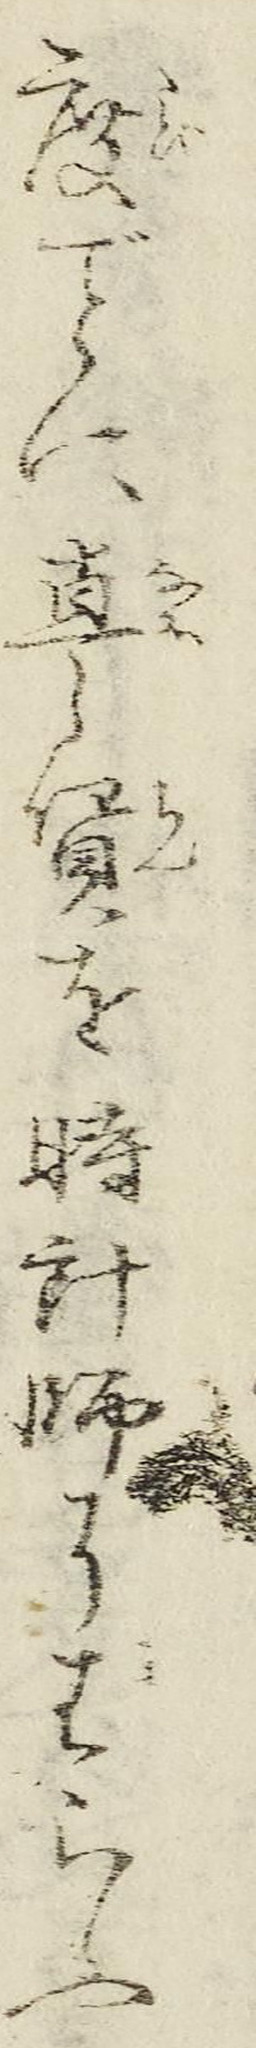度ごとに直し賃を時計師にはらふ
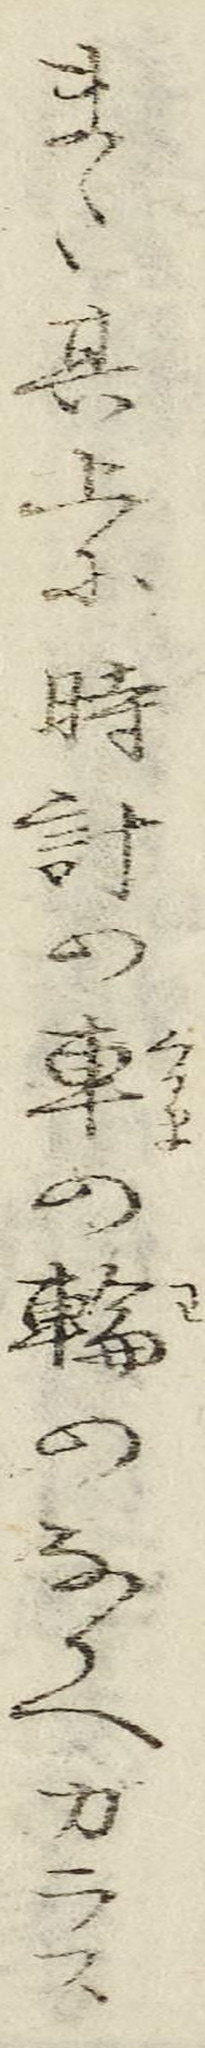また其上に時計の車の輪のなかへガラス
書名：[時計に関する冊子]
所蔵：東京大学地震研究所図書室 Earthquake Research Institute Library, The University of Tokyo, JAPAN
